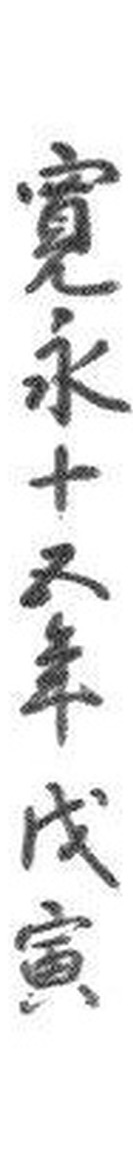寛永十五年戊寅
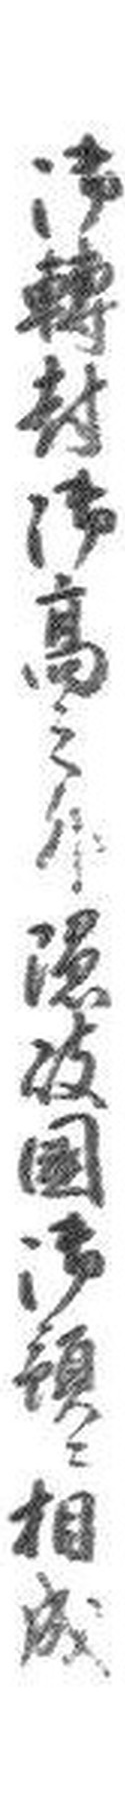御転封御高之外隠岐国御預ニ相成
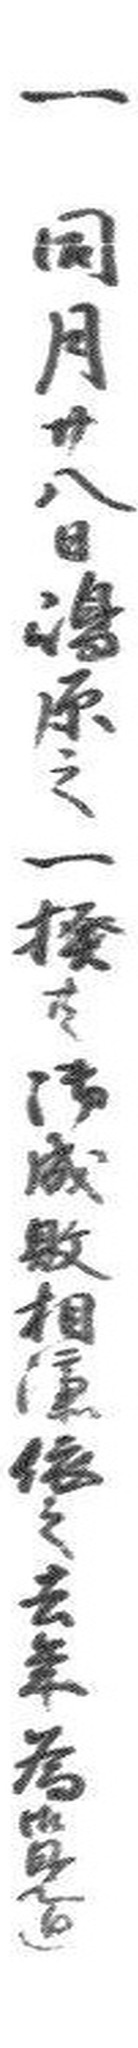一同月廿八日島原之一揆共御成敗相済依之去年為御見廻
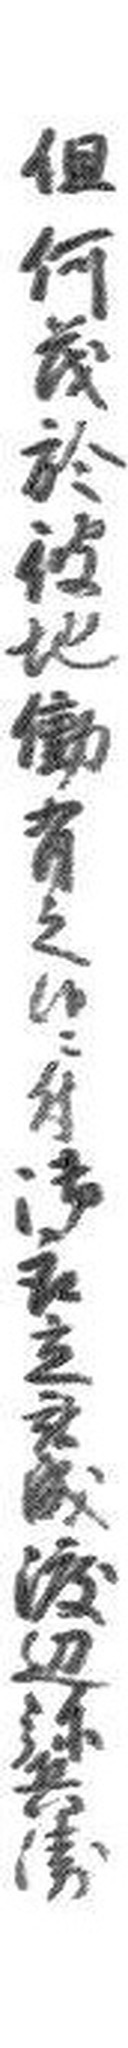但何も於彼地働有之候ニ付御取立被成渡辺弥兵衛

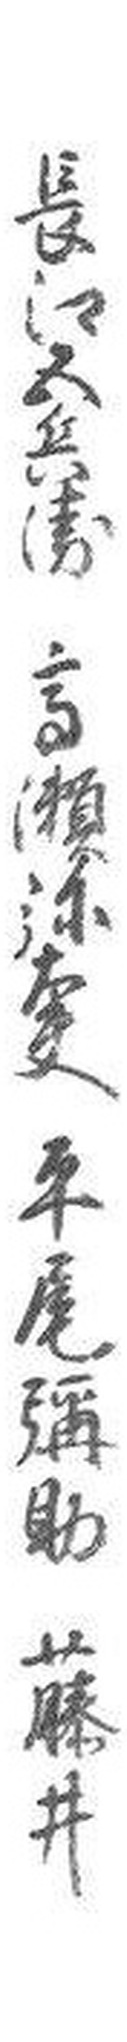長江五兵衛高瀬弥太夫平尾弥助藤井
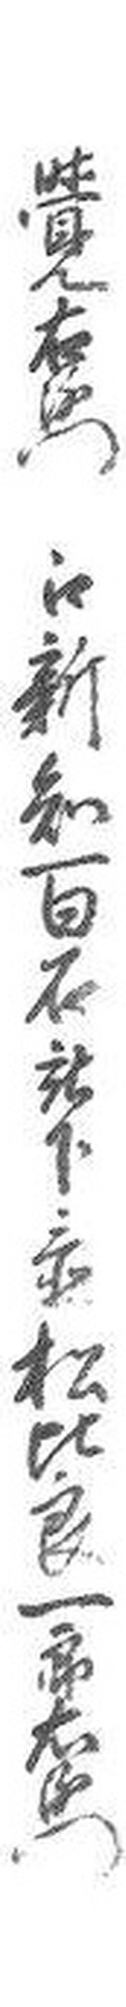覚右衛門江新知百石被下置松比良一郎右衛門
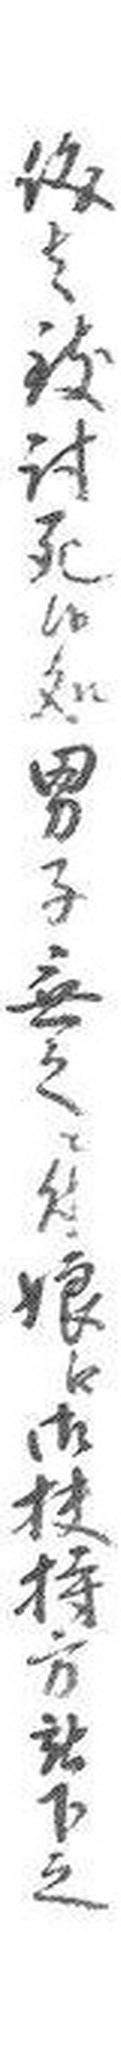儀は致討死候処男子無之ニ付娘江御扶持方被下之
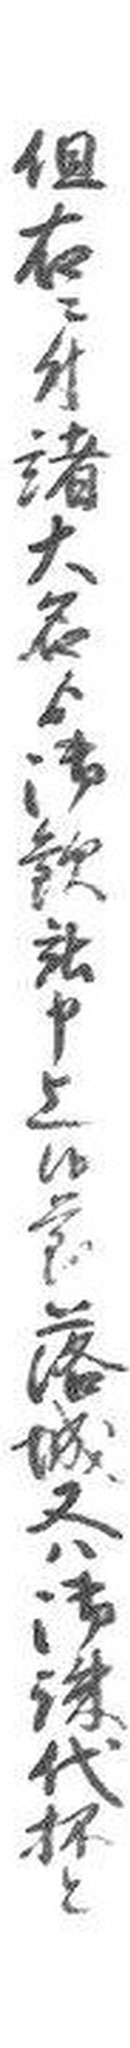但右ニ付諸大名ゟ御歓被申上候節落城又ハ御誅代抔と
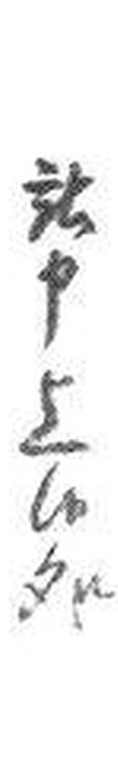被申上候処
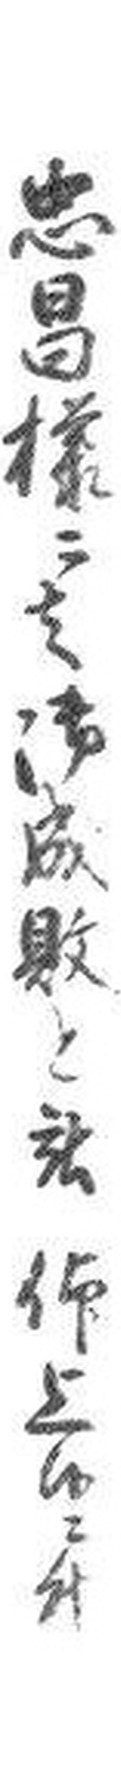忠昌様ニは御成敗と被仰上候ニ付
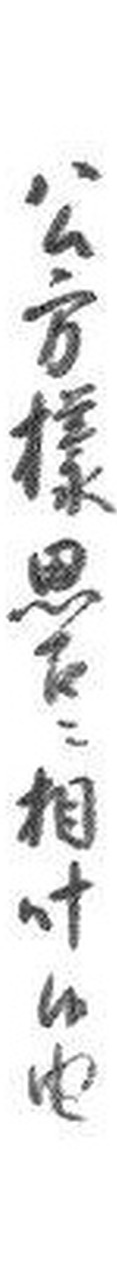公方様思召ニ相叶候由
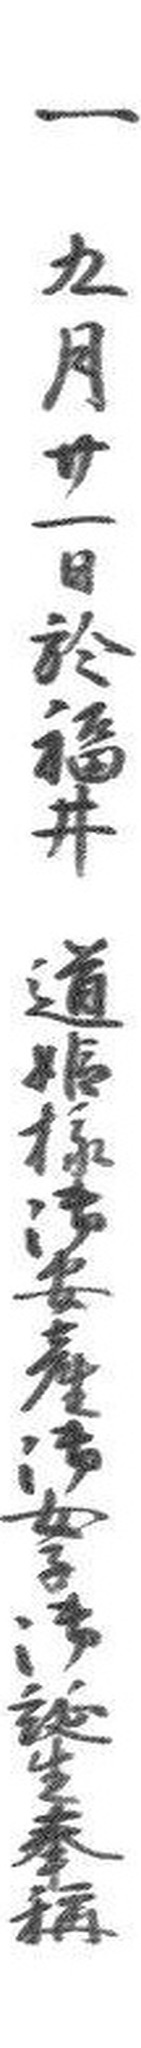一九月廿一日於福井道姫様御安産御女子御誕生奉称
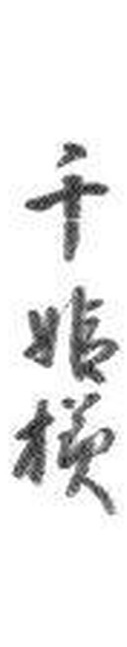千姫様

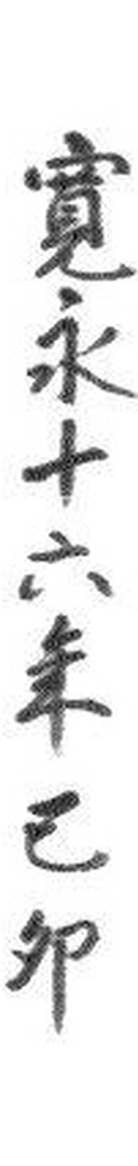寛永十六年己卯
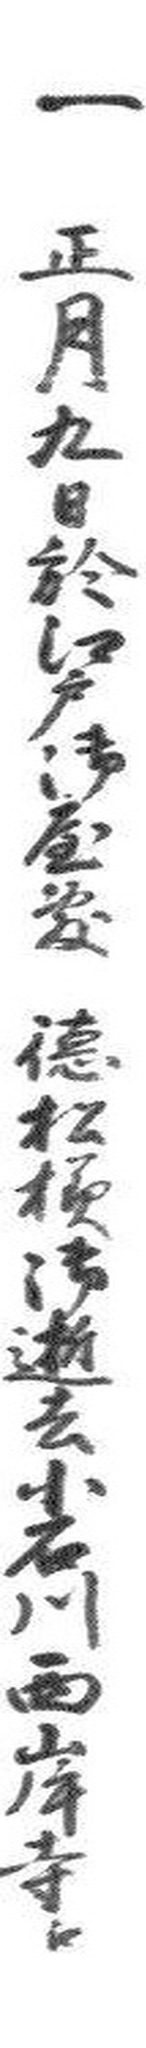一正月九日於江戸御屋敷徳松様御逝去小石川西岸寺江
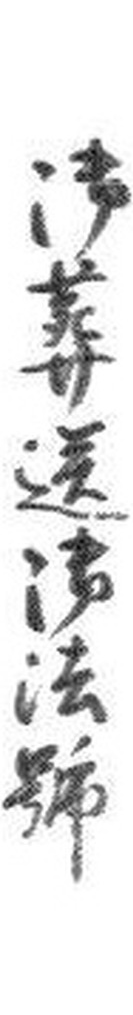御葬送御法号
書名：家譜 四 忠昌公 従寛永七年到正保四年
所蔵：福井県文書館 Fukui Prefectural Archives
